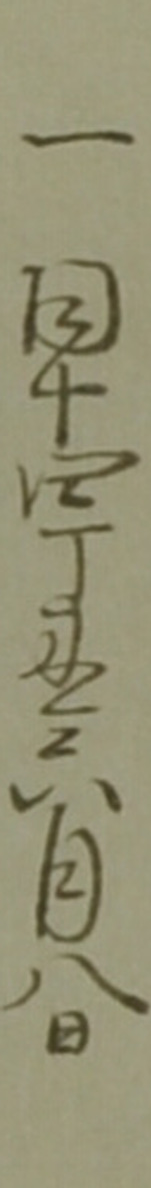一同十四丁丑六月八日
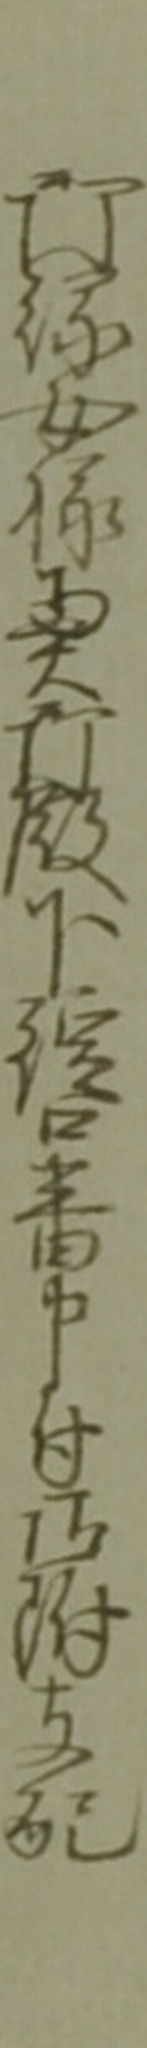御縁女様奥御殿下錠口番申付御附支配
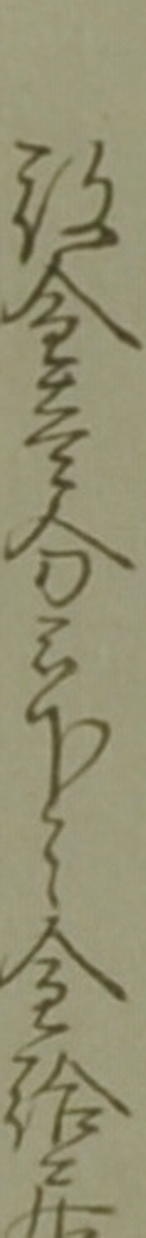役金壱分被下之金給居
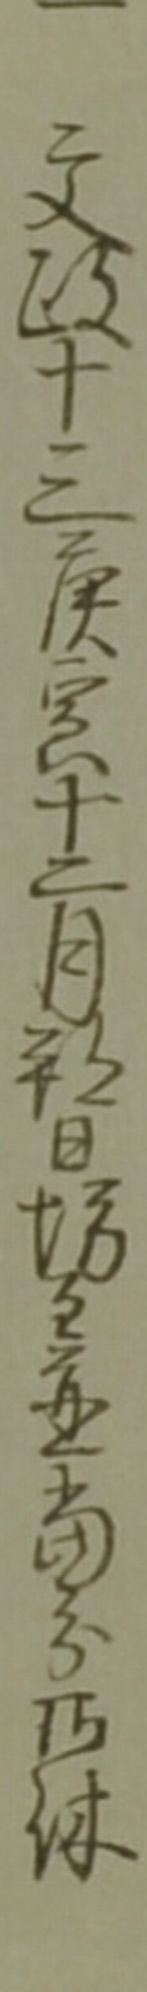一文政十三庚寅十二月朔日坊主並当分御休
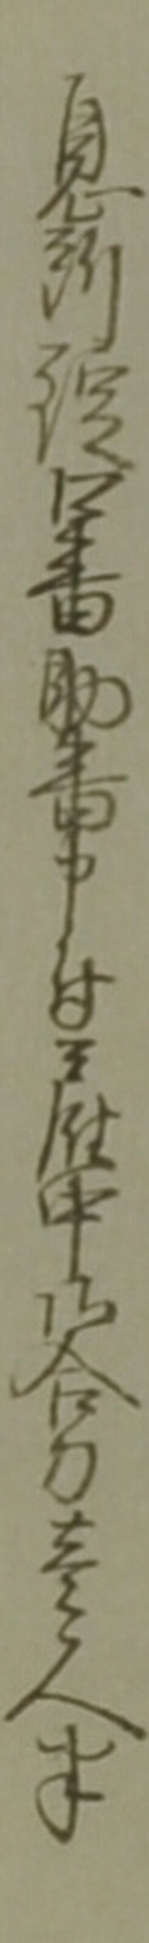息所錠口番助番申付雇中御合力壱人半
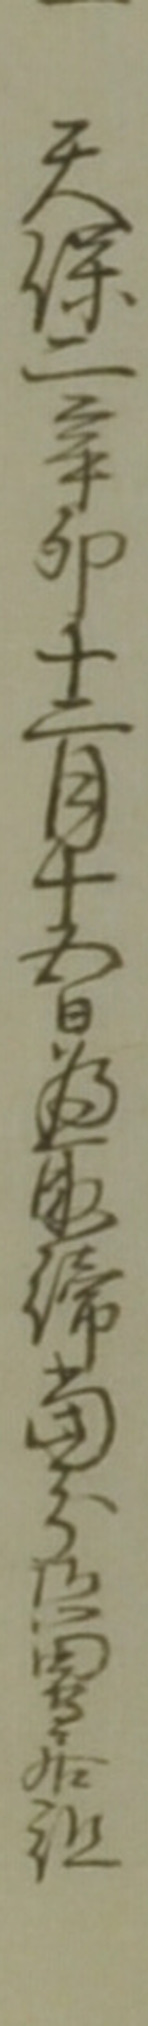一天保二辛卯十二月十五日為取締当分御留守居組
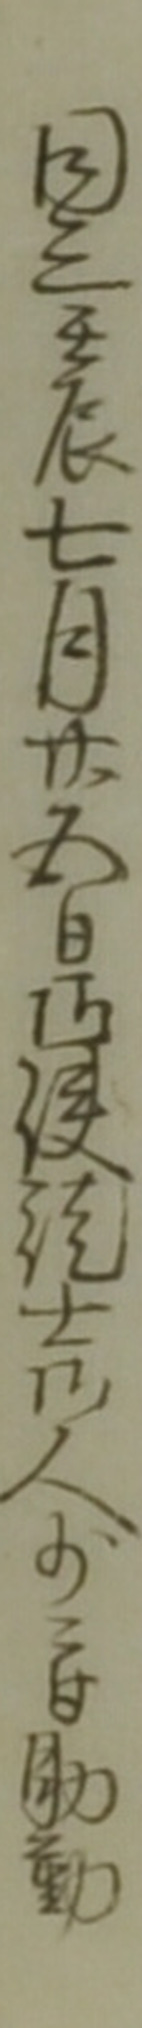一同三壬辰七月廿五日御使徒士御人少ニ付助勤
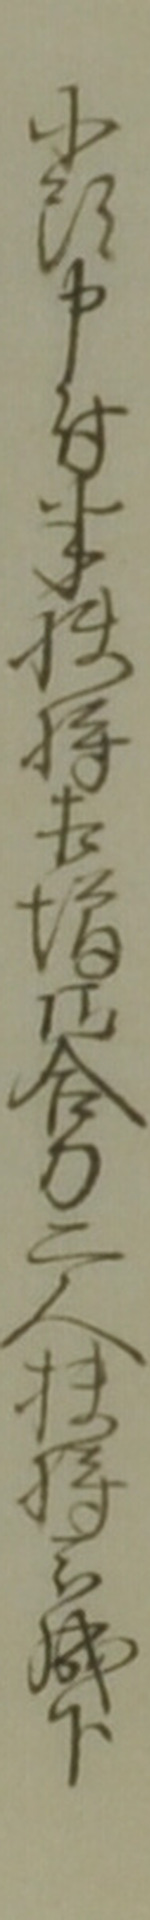小頭申付半扶持相増御合力二人扶持被成下
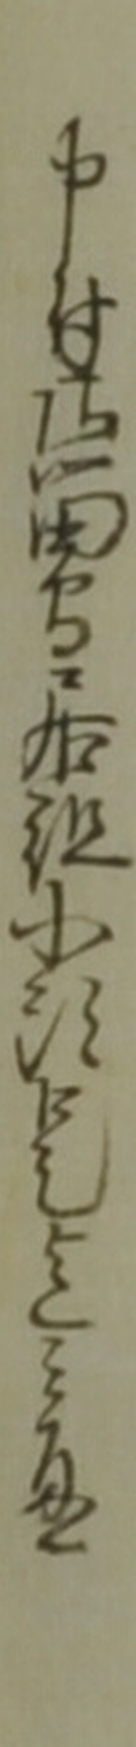申付御留守居組小頭是迄之通
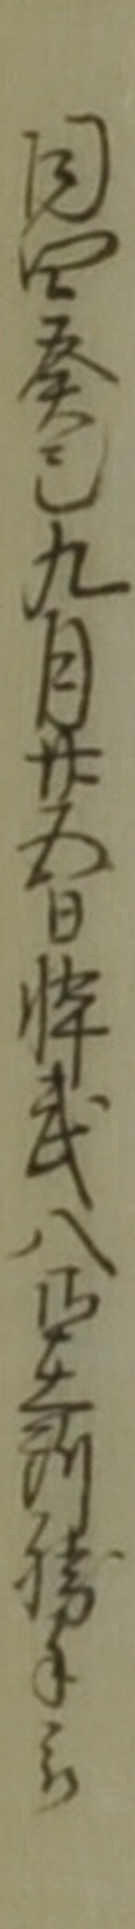一同四癸未九月廿五日忰武八御在所勝手被
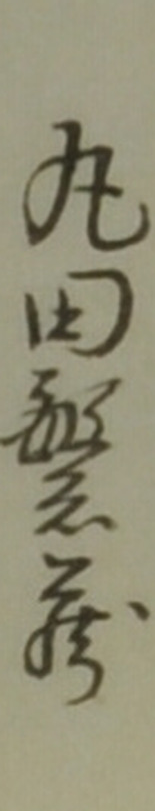丸田繁蔵
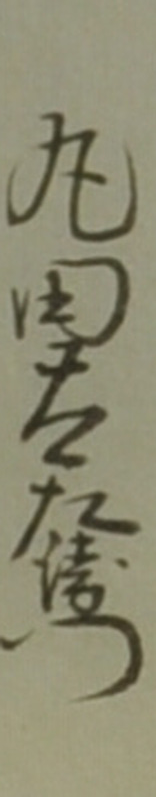丸田太左衛門
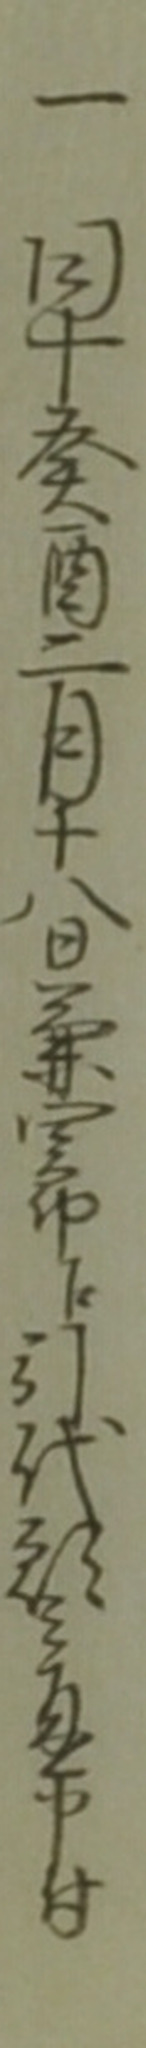一同十癸酉二月十八日兼四郎江引代願之通申付
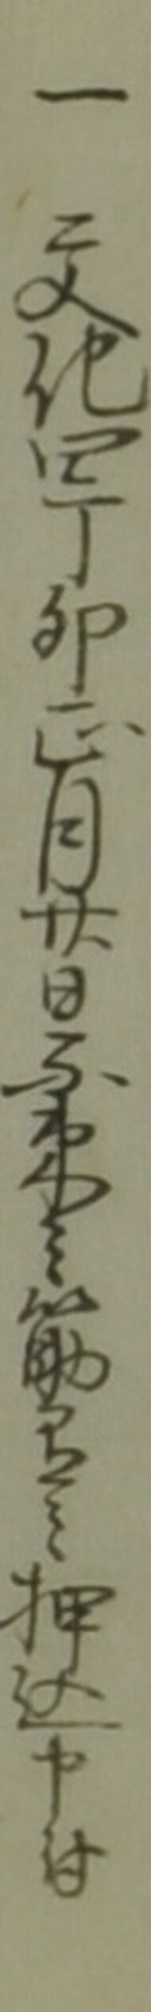一文化四丁卯正月廿日不束之筋有之押込申付
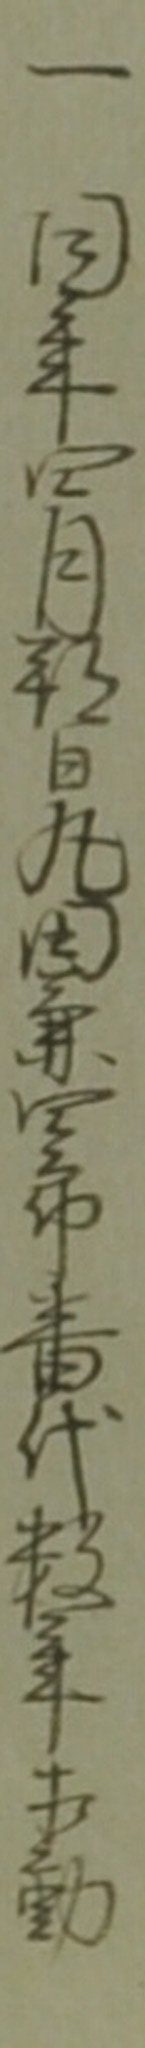一同年四月朔日丸田兼四郎番代数年相勤
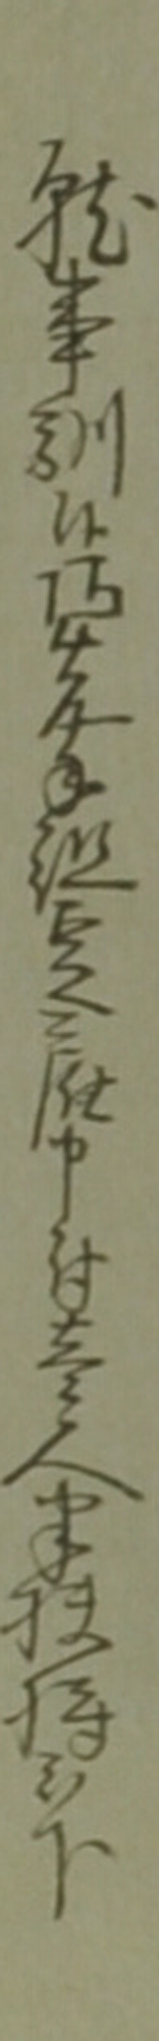就事馴候御先手組定雇申付壱人半扶持被下
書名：無足諸士勤仕録（九）
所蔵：伊那市立高遠町図書館・合同会社AMANE
